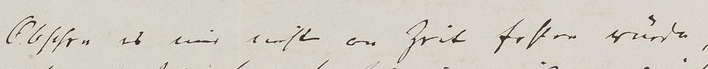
Obschon es mir nicht an Zeit fehlen würde,
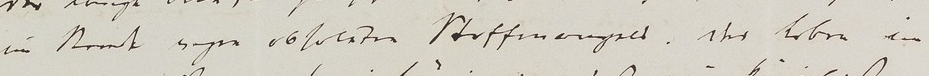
im Stande wegen absoluten Stoffmangels. Das Leben im
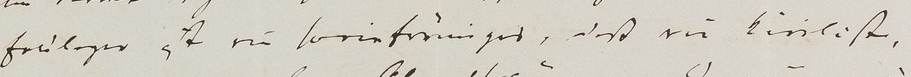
Feldlager ist ein so einförmiges, daß ein Civilist,
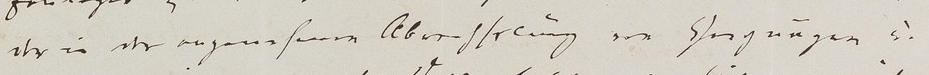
der in der angenehmen Abwechslung von Vergnügen u.
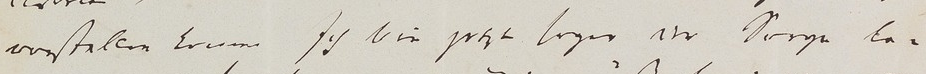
vorstellen kann. Ich bin jetzt sogar der Sorge le-
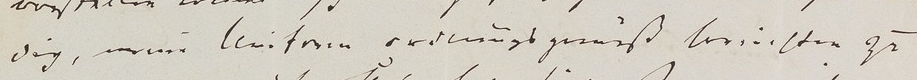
dig, meine Uniform ordnungsgemäß herrichten zu
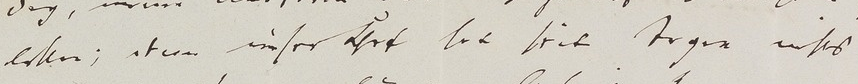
lassen; denn unser Chef hat seit Tagen nichts
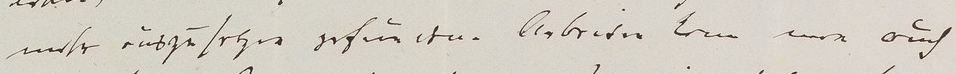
mehr auszusetzen gefunden. Arbeiten kann man auch
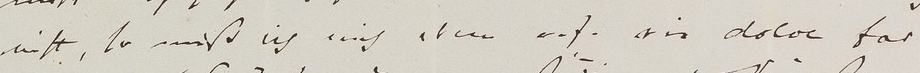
nicht, so muß ich mich denn auf ein dolce far
